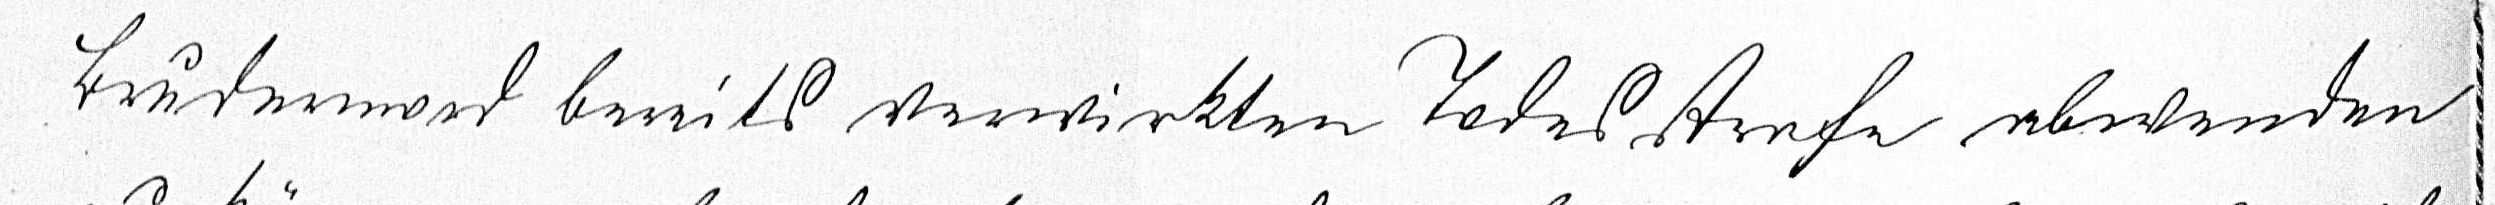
Brudermord bereits verwirkten Todesstrafe abwenden
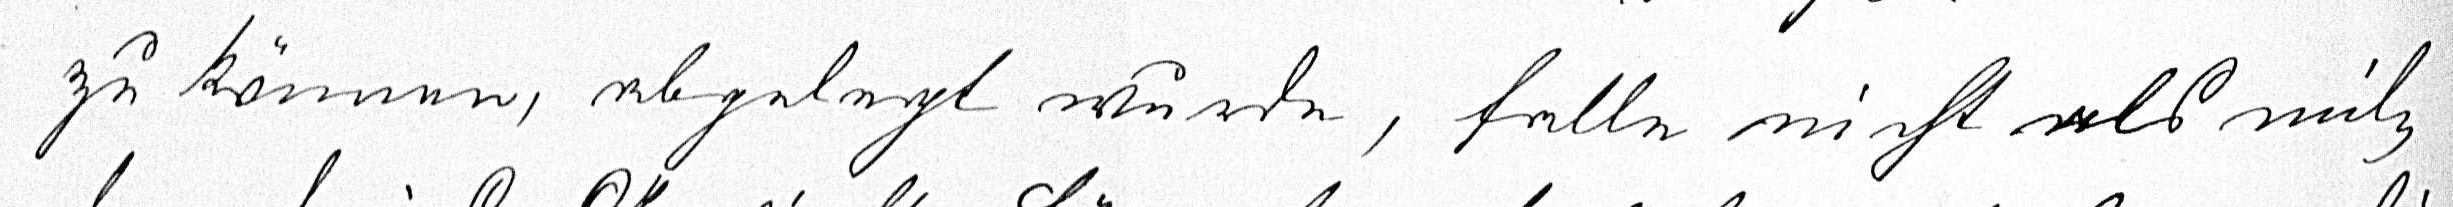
zu können, abgelegt wurde, falle nicht als mil¬
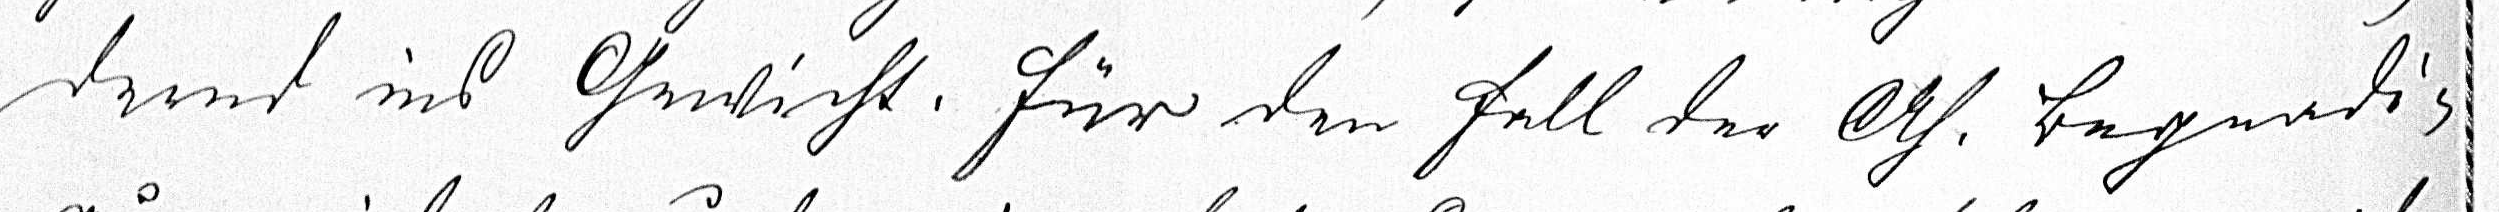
dernd ins Gewicht. Für den Fall der Ah. Begnadi¬
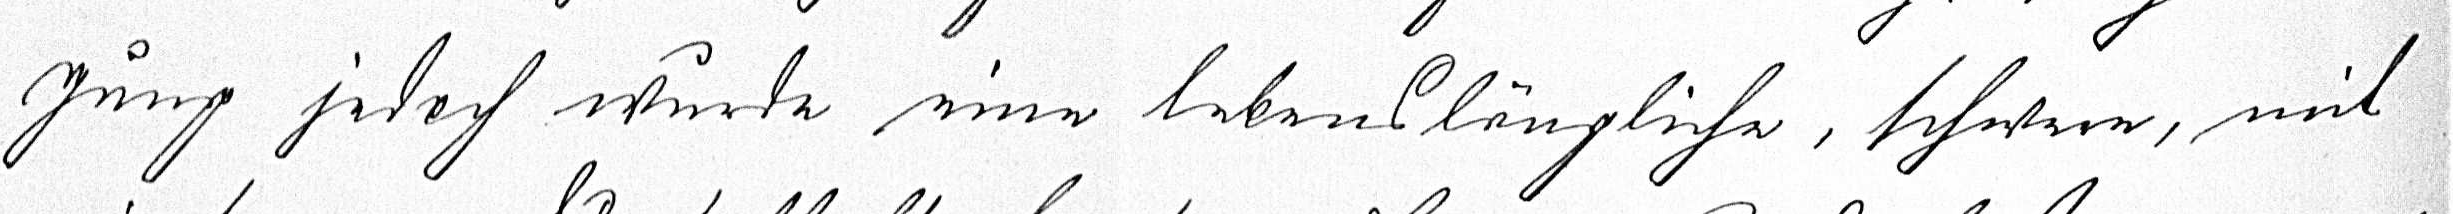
gung jedoch wurde eine lebenslängliche, schwere, mit
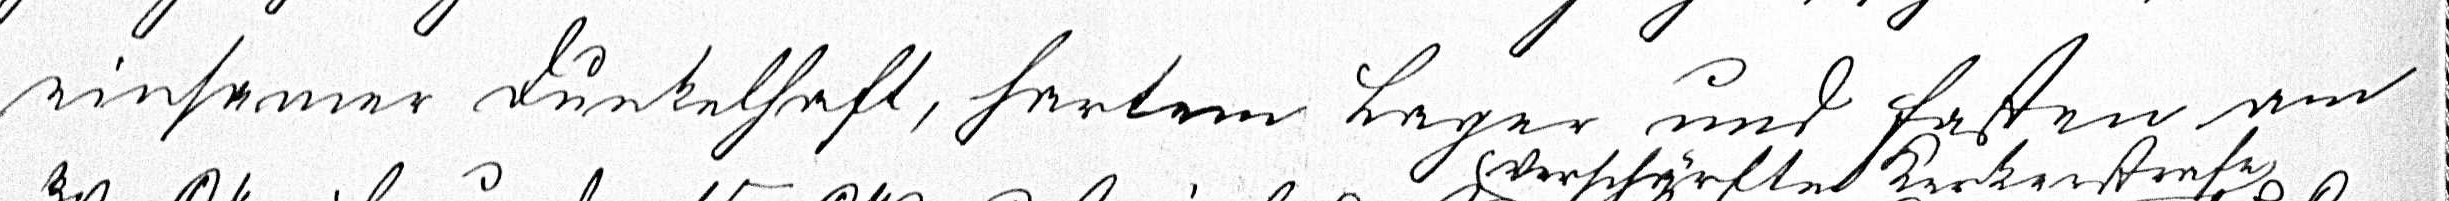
einsamer Dunkelhaft, hartem Lager und Fasten am
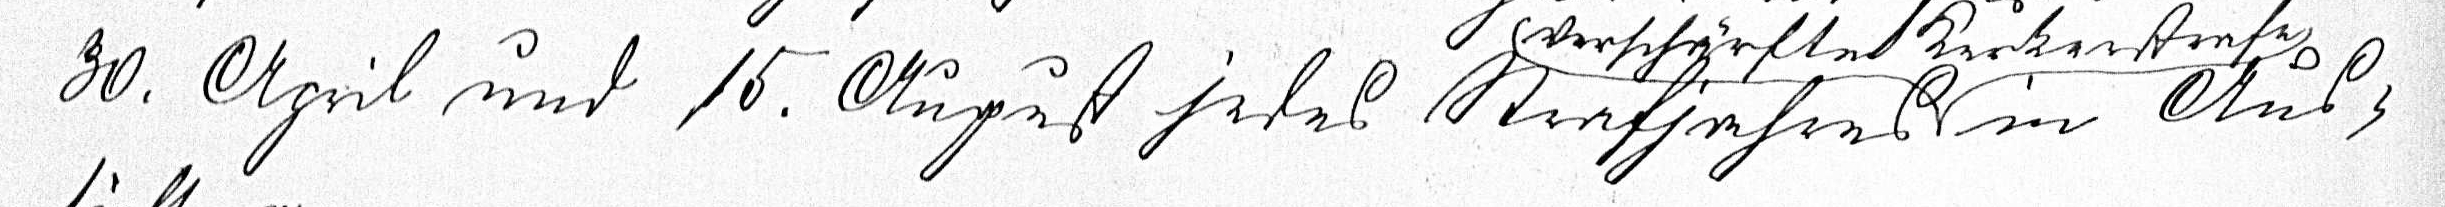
30. April und 15. August jedes Strafjahres verschärfte Kerkerstrafe in Aus¬
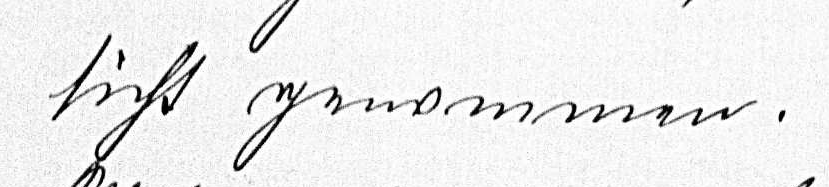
sicht genommen.
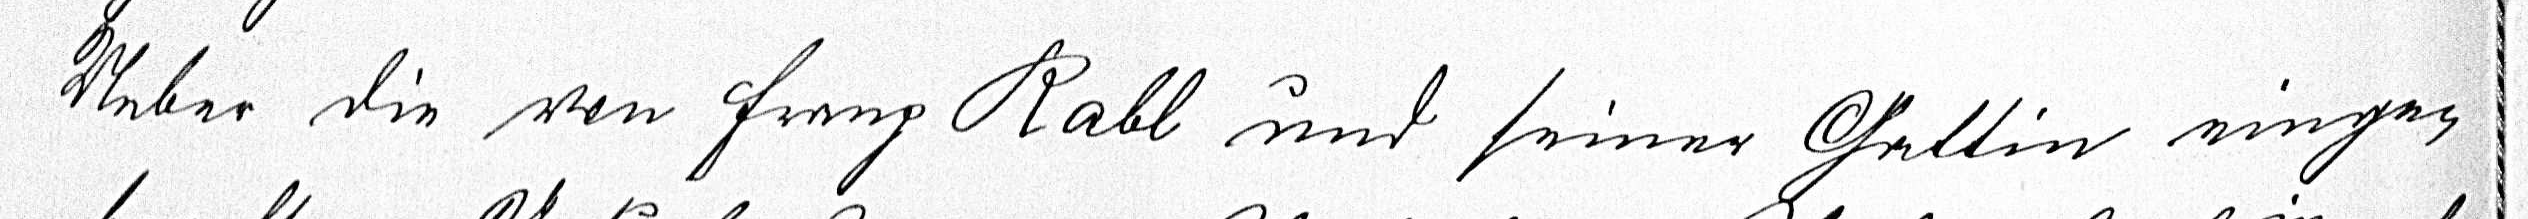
Ueber die von Franz Rabl und seiner Gattin einge¬
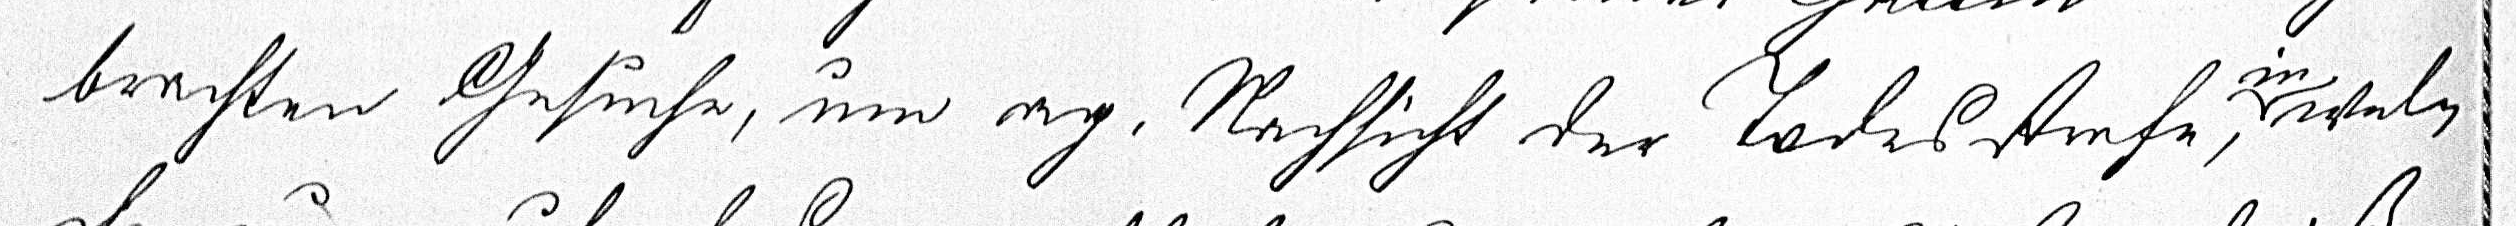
brachten Gesuche, um ag. Nachsicht der Todesstrafe, in wel¬
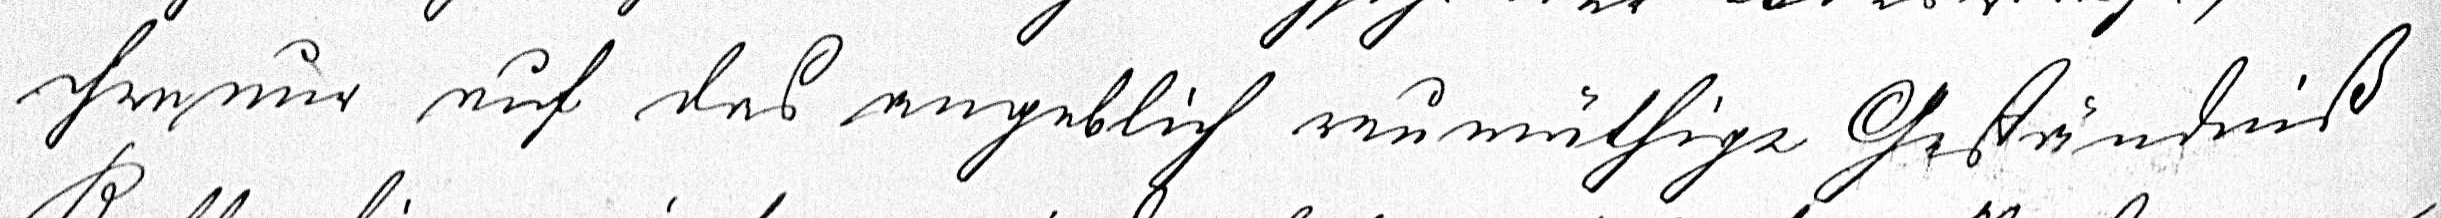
chen nur auf das angeblich reumüthige Geständniß
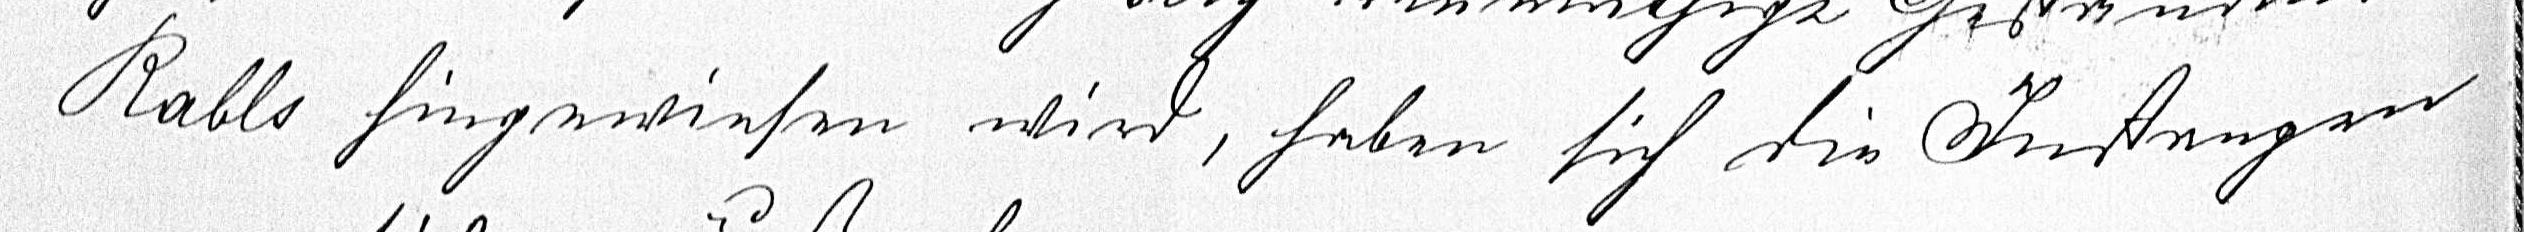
Rabls hingewiesen wird, haben sich die Instanzen
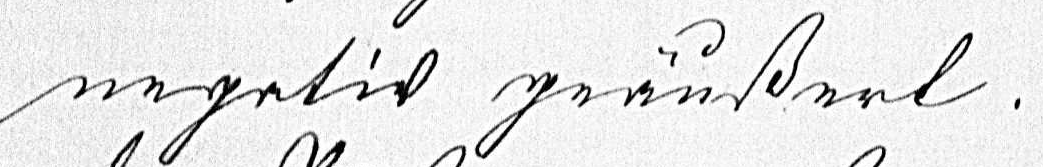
negativ geäußert.
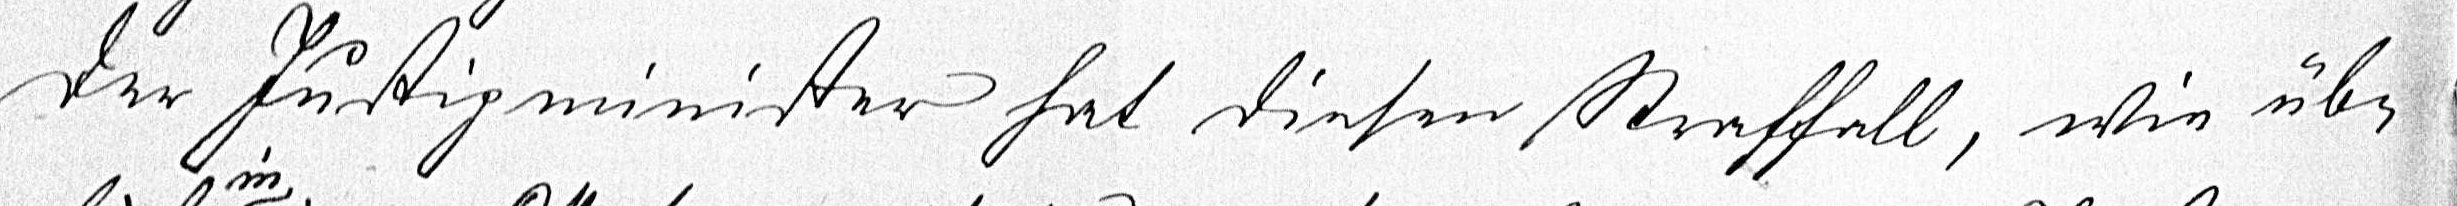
Der Justizminister hat diesen Straffall, wie üb¬
